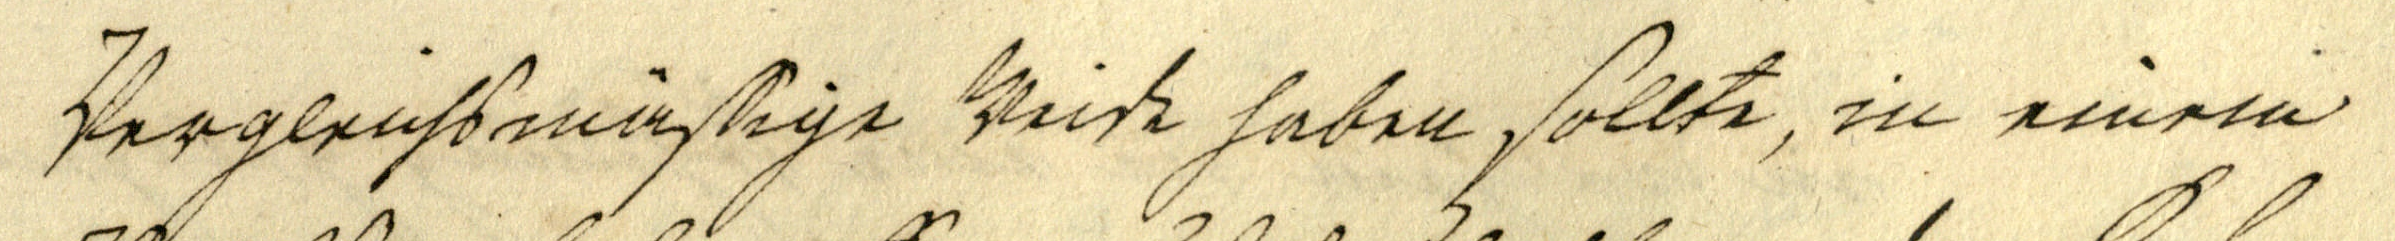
Vergleichsmässige Weide haben sollte, in einem
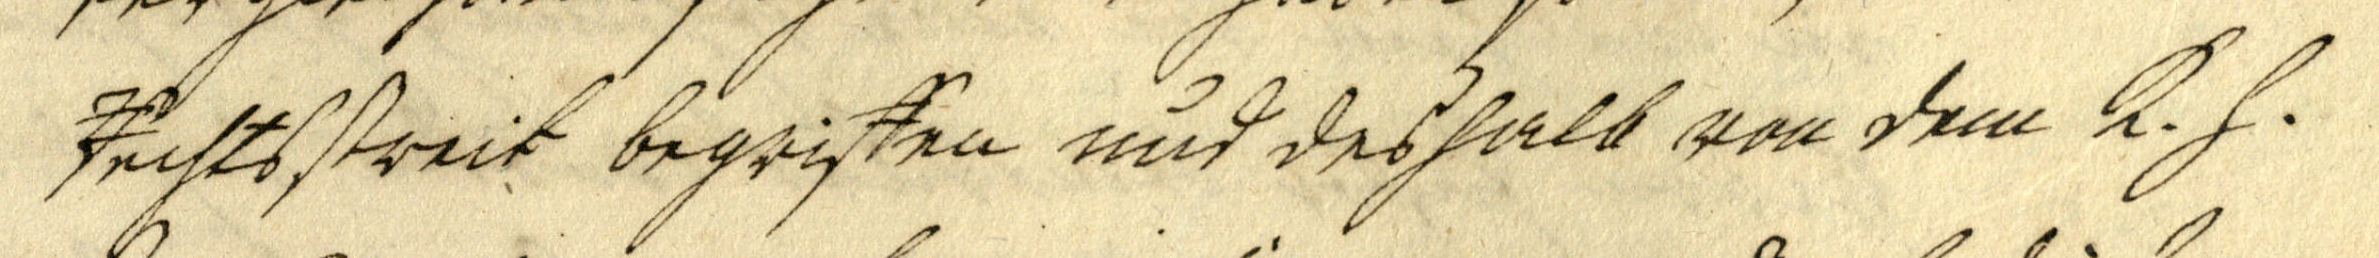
Rechtsstreit begriffen und deshalb von dem K. H.
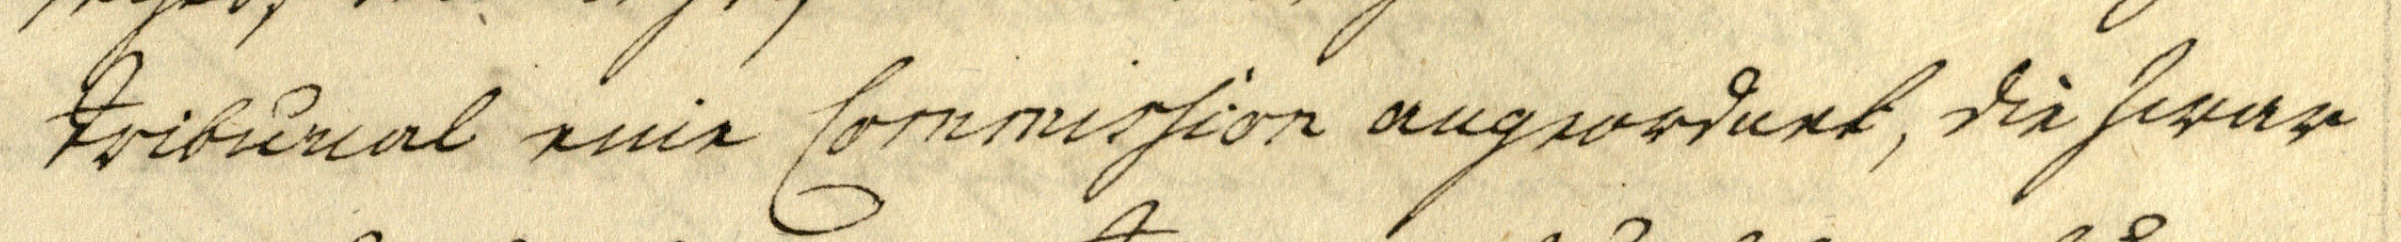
Tribunal eine Commission angeordnet, die zwar
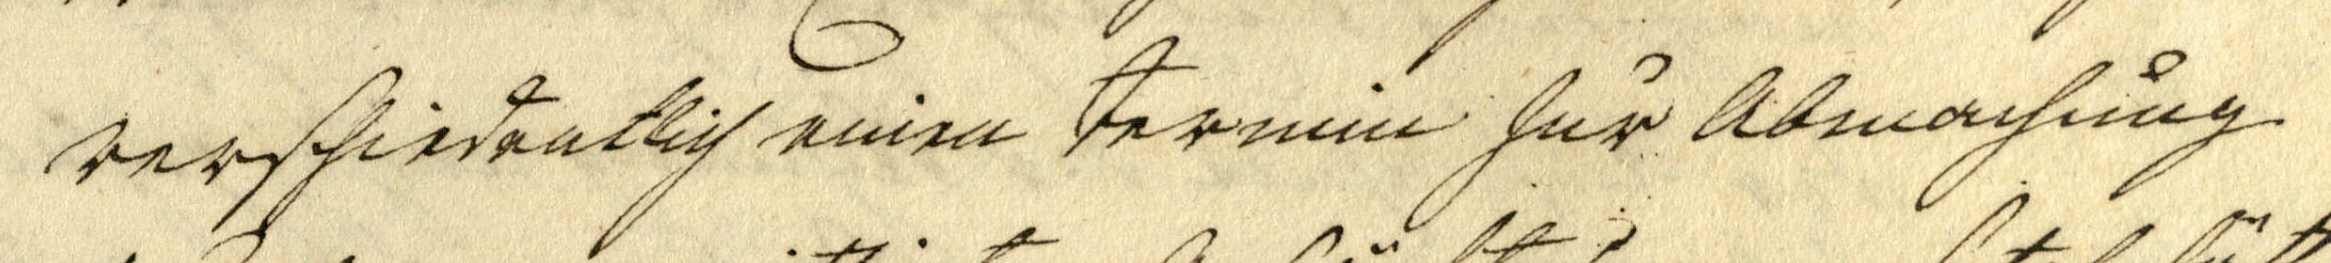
verschiedentlich einen Termin zur Abmachung
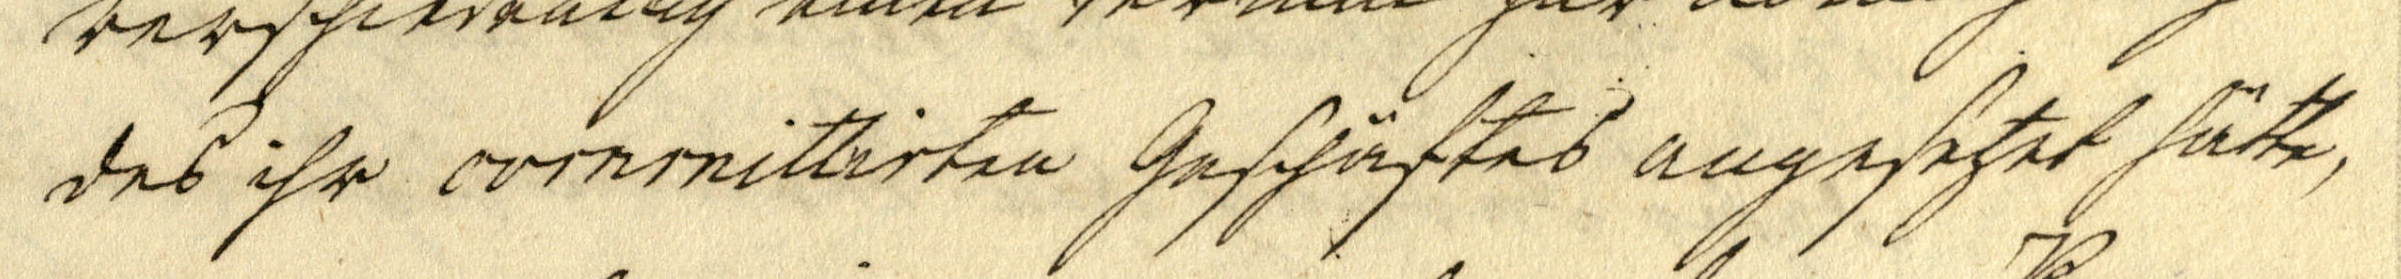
des ihr committirten Geschäftes angesetzet hätte,
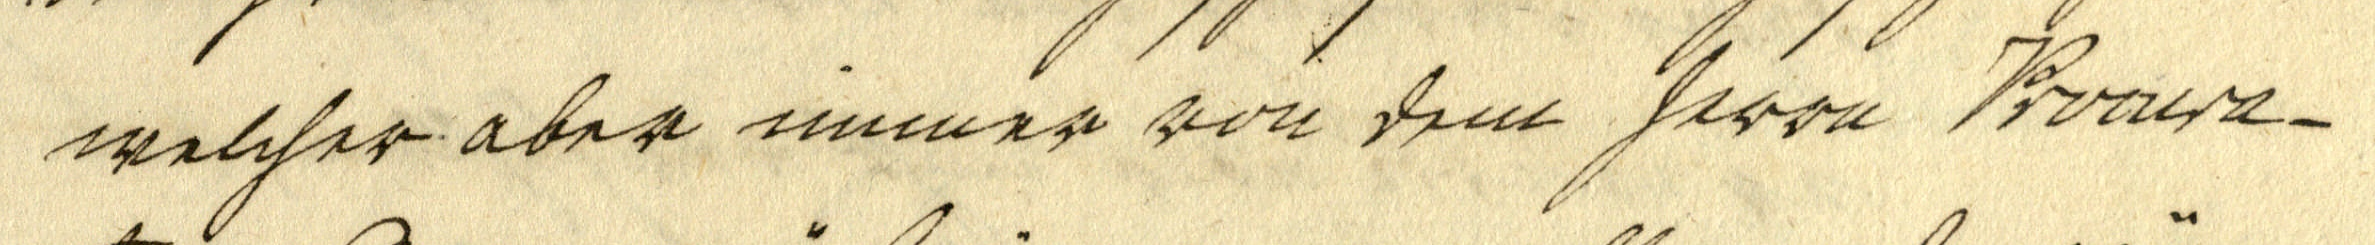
welcher aber immer von dem herrn Procura-
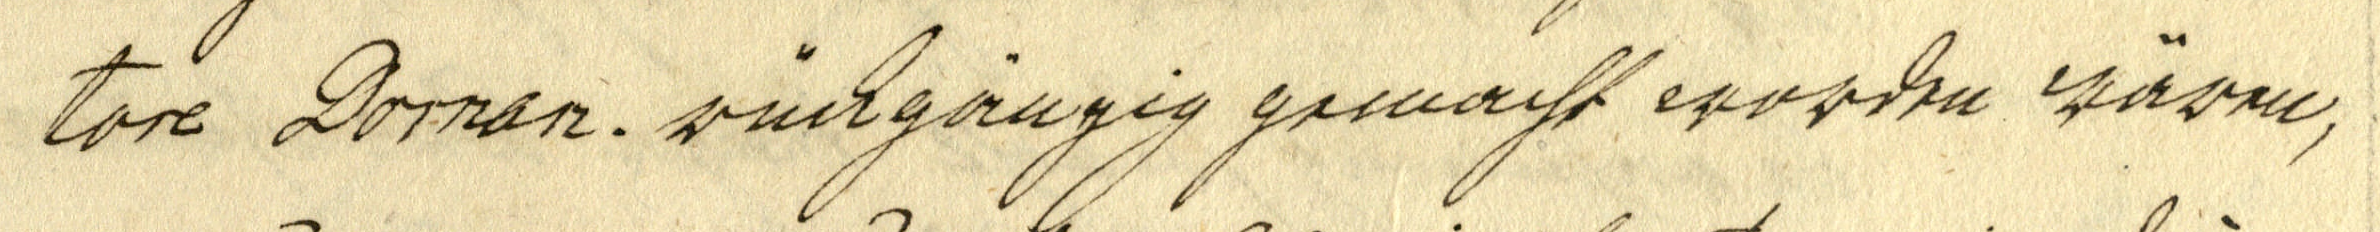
tore Doman. rückgängig gemacht worden wären,
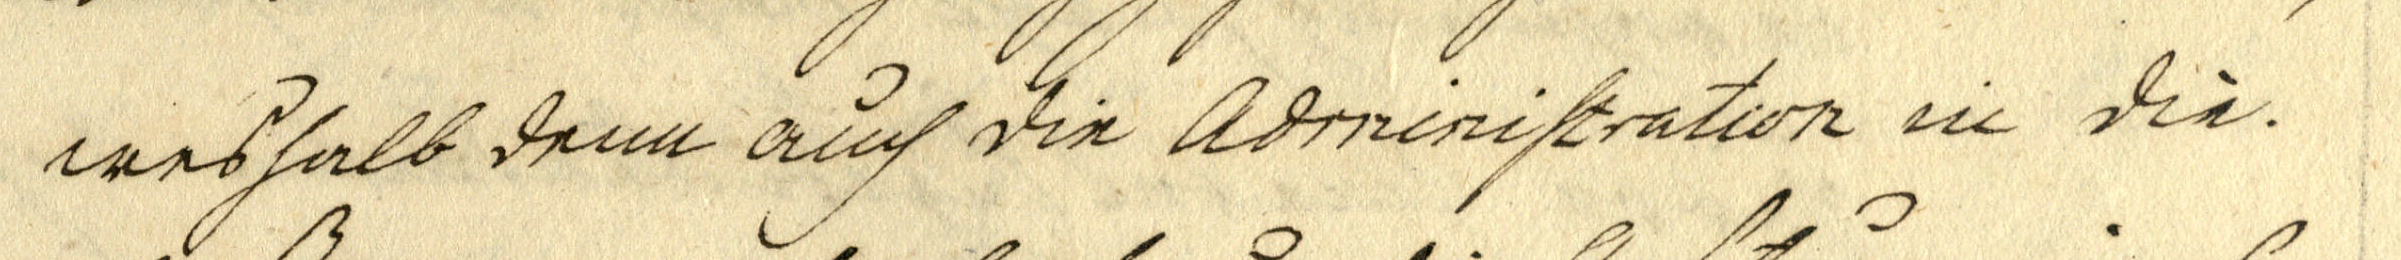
weshalb denn auch die Administration in die-
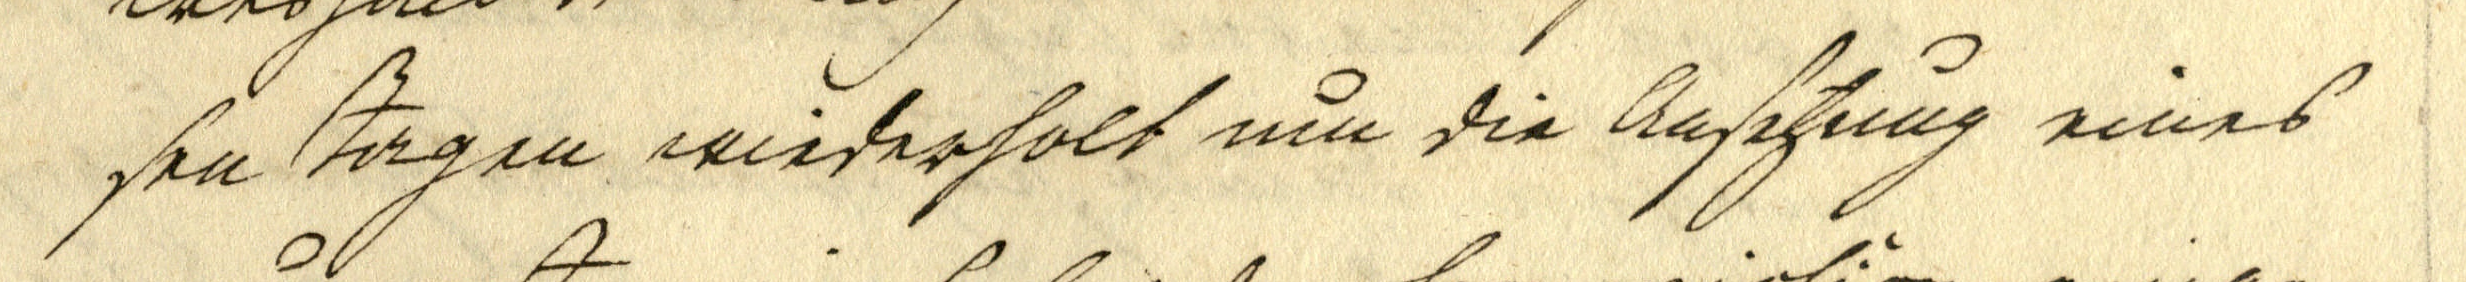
sen Tagen wiederholt um die Ansetzung eines
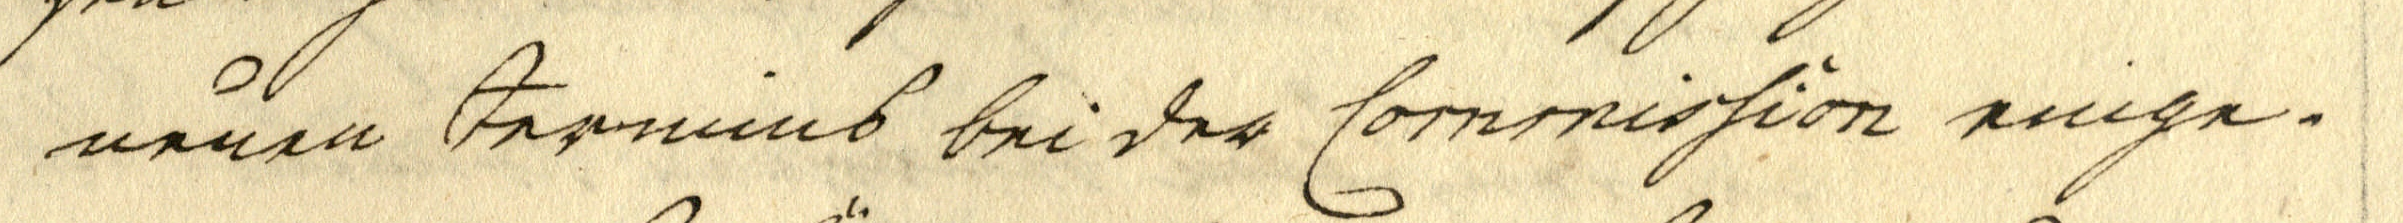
neuen Termins bei der Commission einge-
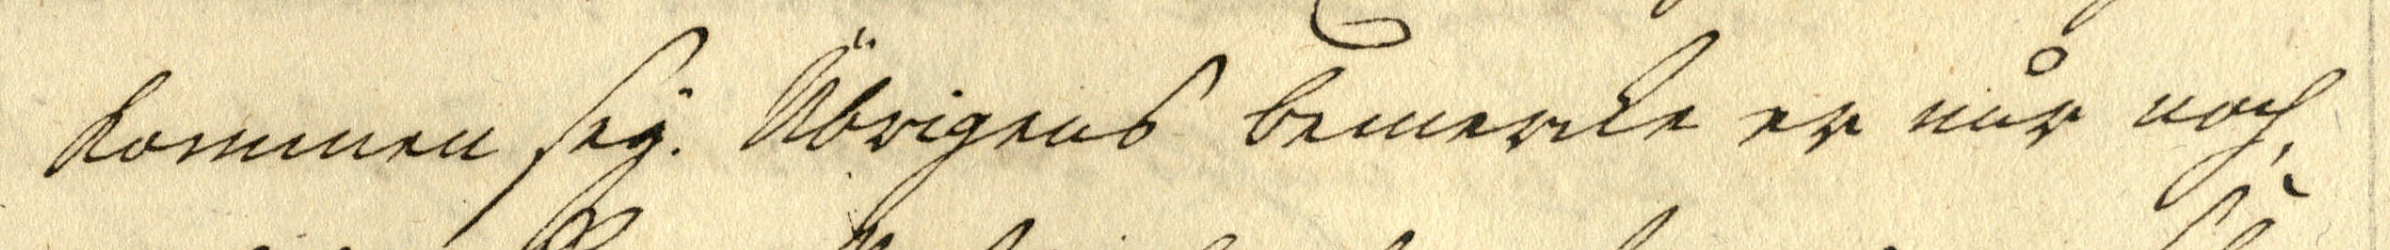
kommen sey. Übrigens bemerke er nur noch,
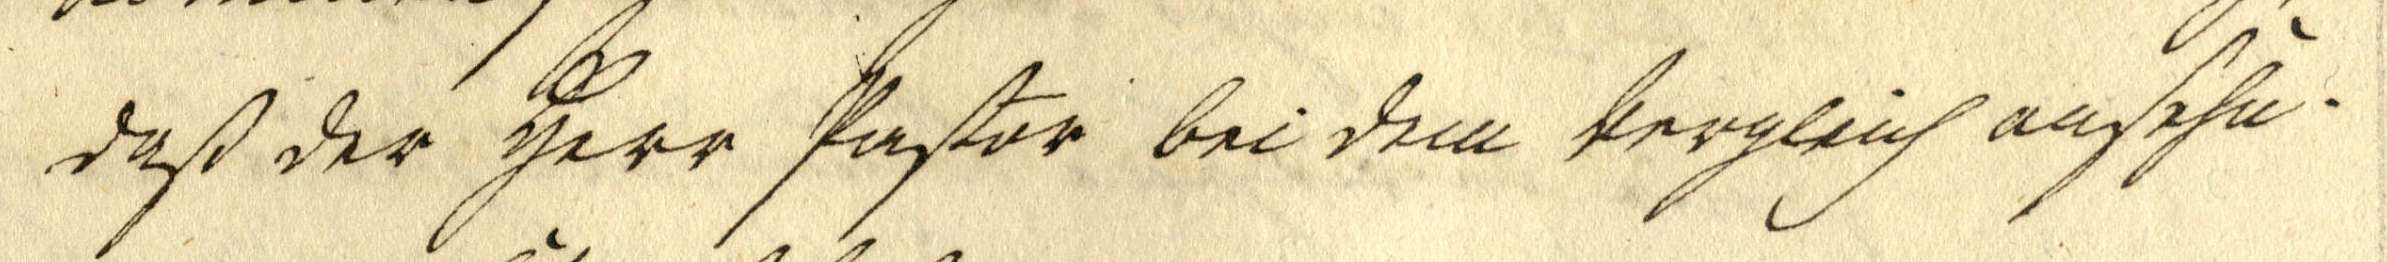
daß der Herr Pastor bei dem Vergleich ansehn-
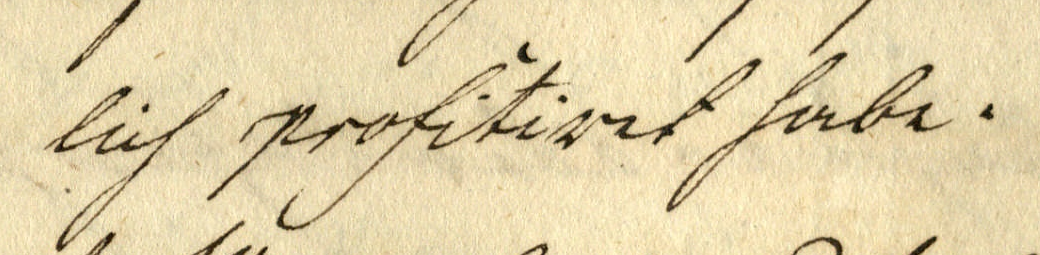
lich profitiret habe.
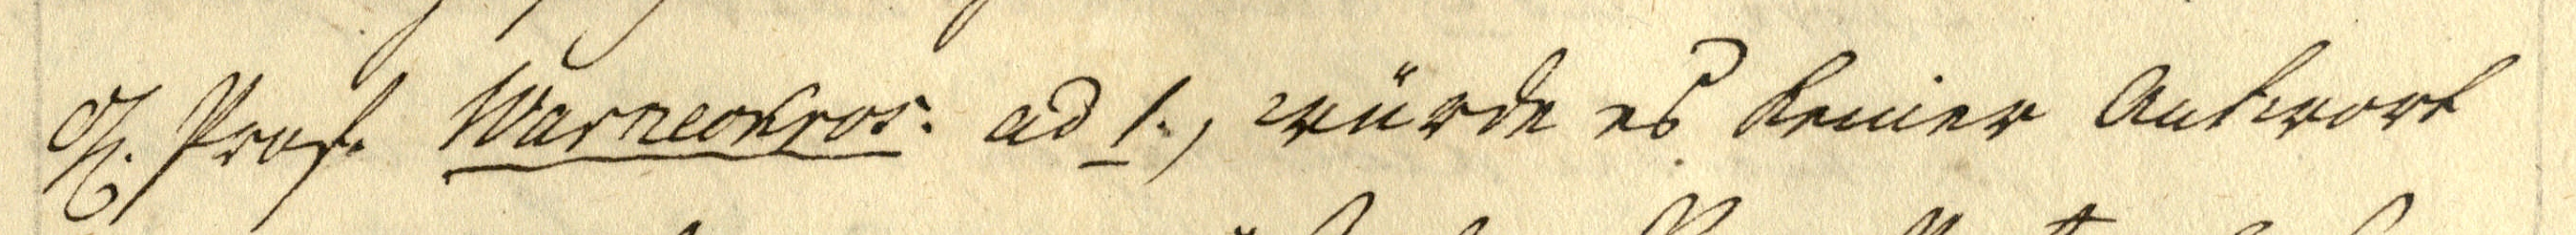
dh. Prof. Warneckros. ad 1., würde es keiner Antwort
